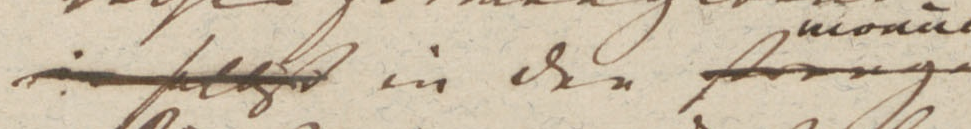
in selbst in den strengeren
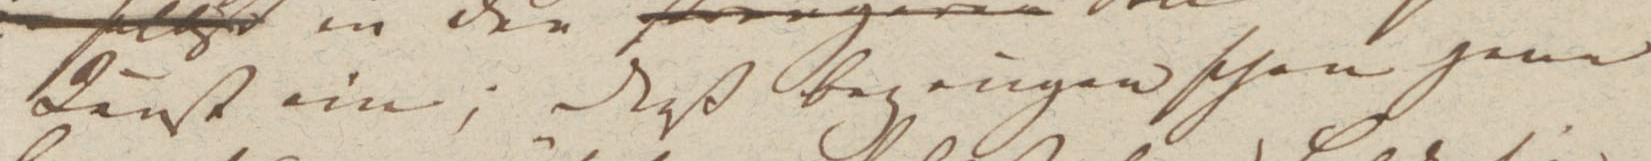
Kunst ein; Diess bezeugen schon jene
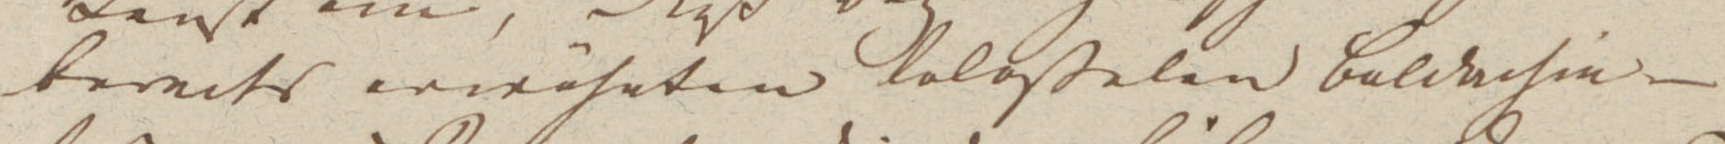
bereits erwähnten kolossalen Baldachin-
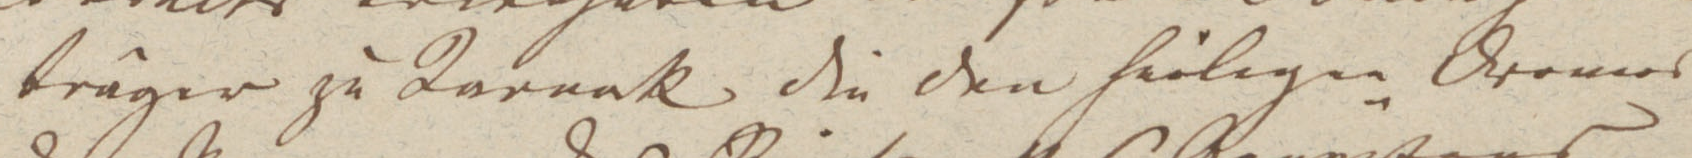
träger zu Karnak die den heiligen Dromos
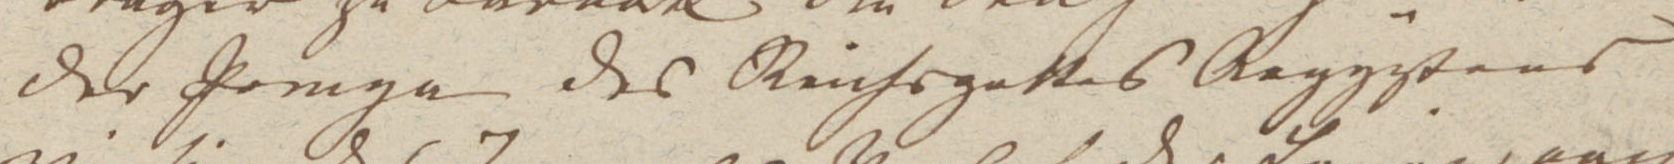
der Pompa des Reichsgottes Aegyptens
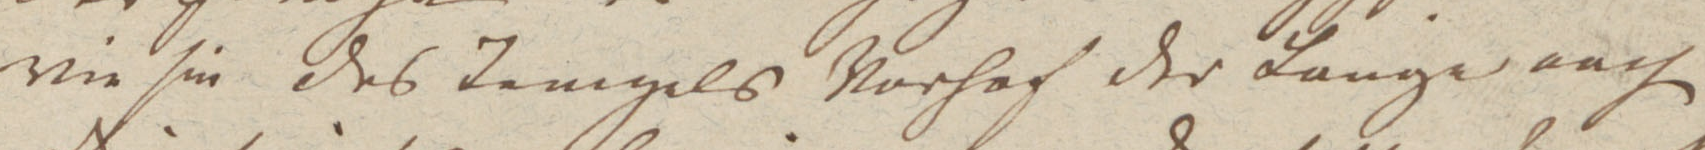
wie sie des Tempels Vorhof der Länge nach
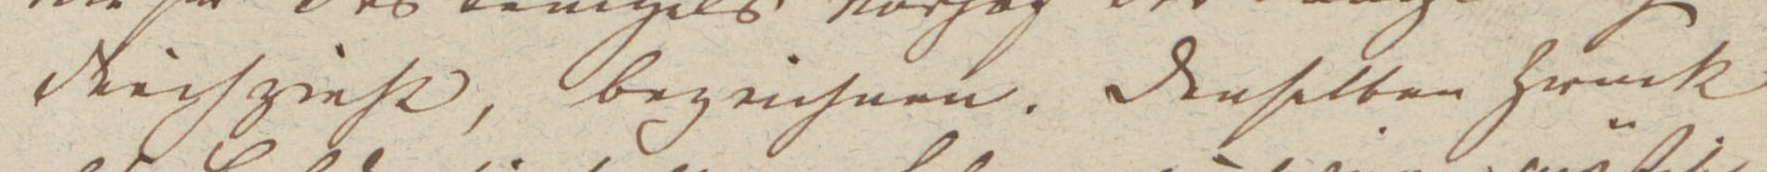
durchzieht, bezeichnen. Denselben Zweck
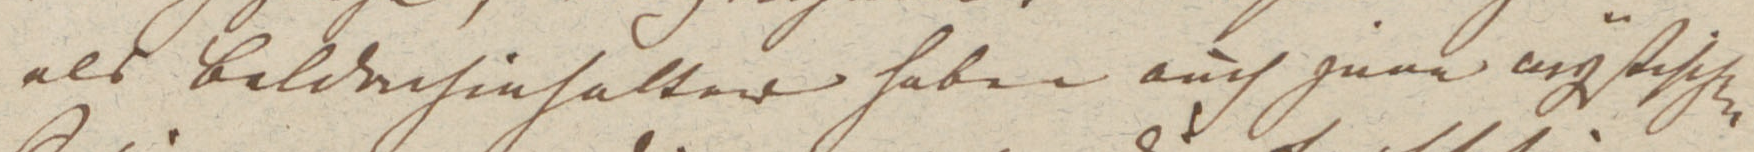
als Baldachinhalter haben auch jene mystischen
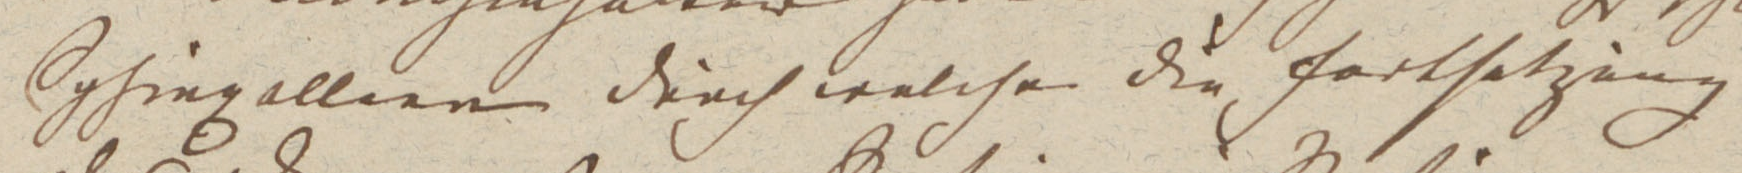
Sphinxalleen durch welche die Fortsetzung
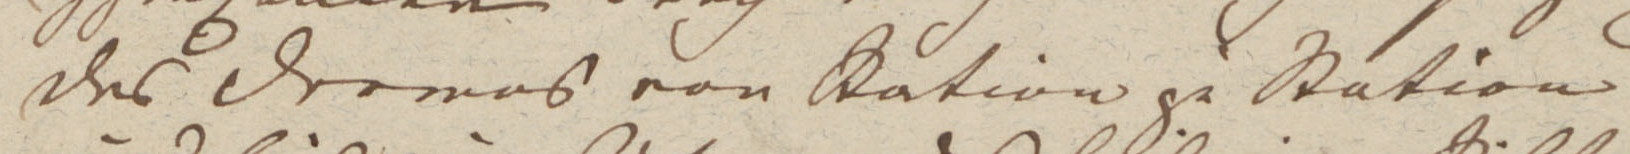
des Dromos von Station zu Station
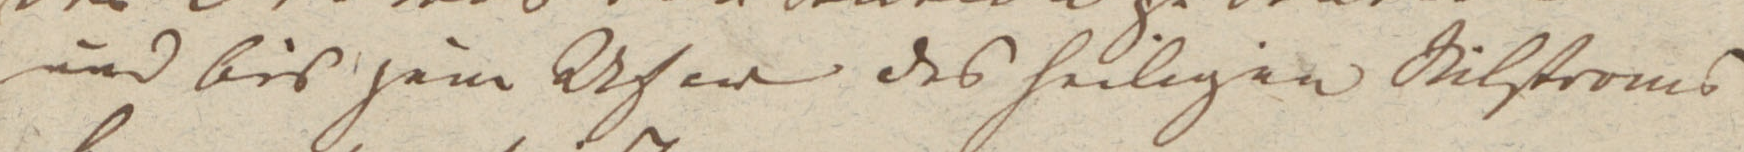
und bis zum Ufer des heiligen Nilstroms
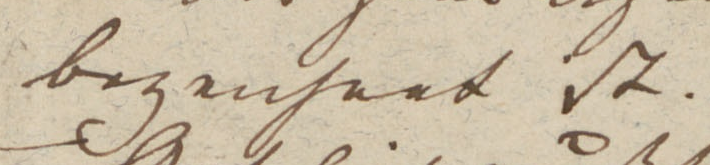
bezeichnet ist.
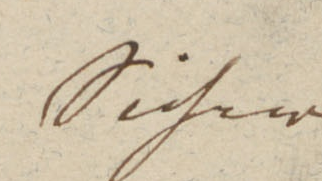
Sicher
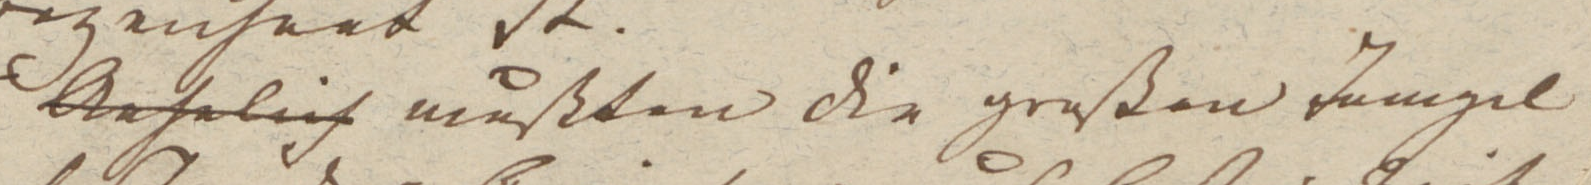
Aehnlich mussten die grossen Tempel-
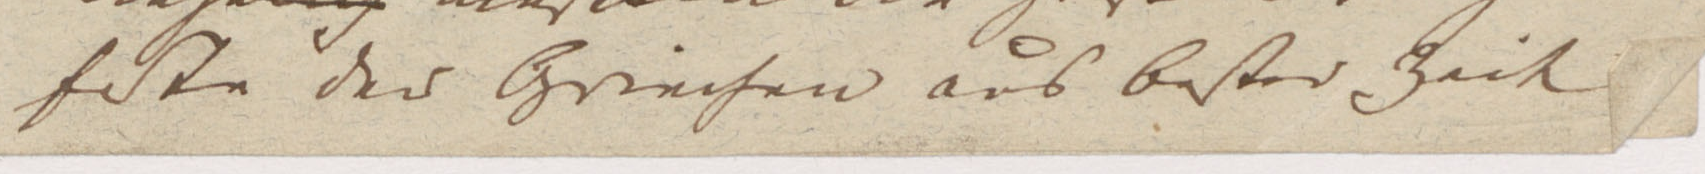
feste der Griechen aus bester Zeit
